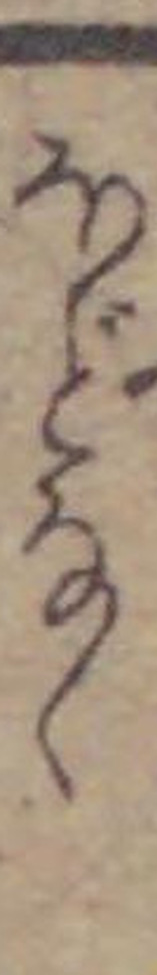ほどなく
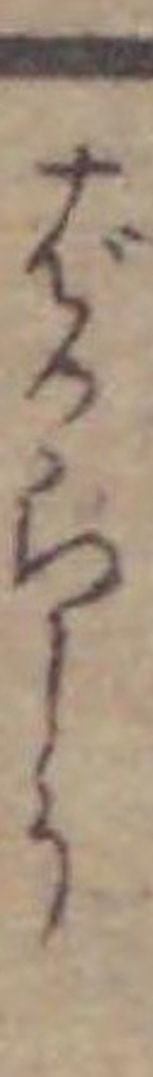ばからしう
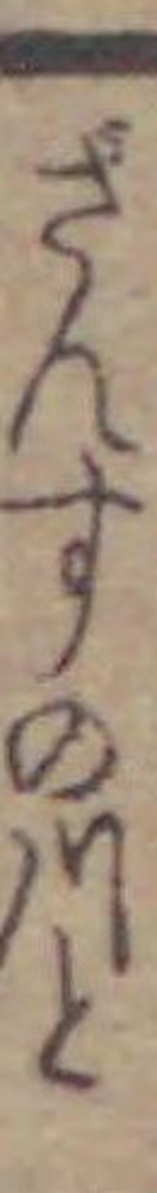ざんすの川と
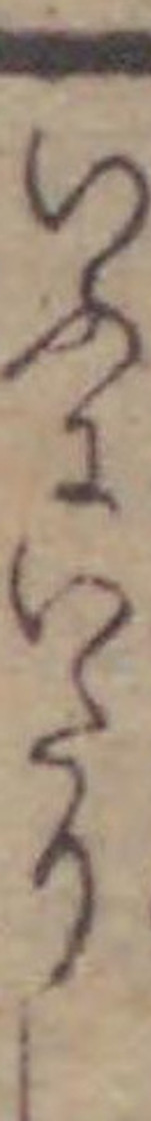いふにいたり
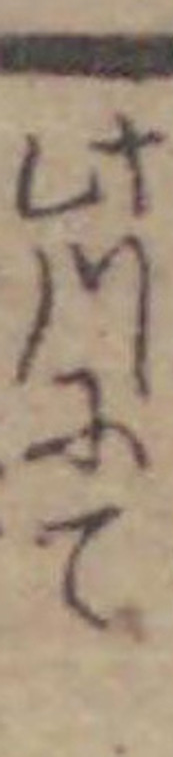此川にて
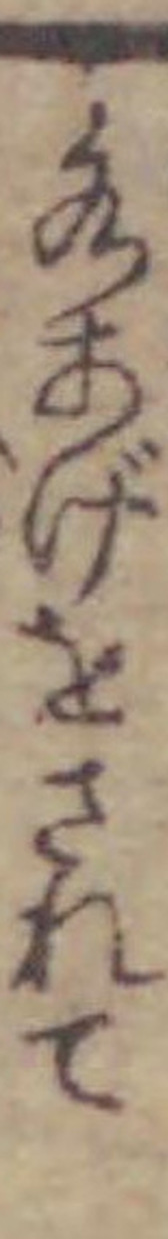水あげをされて
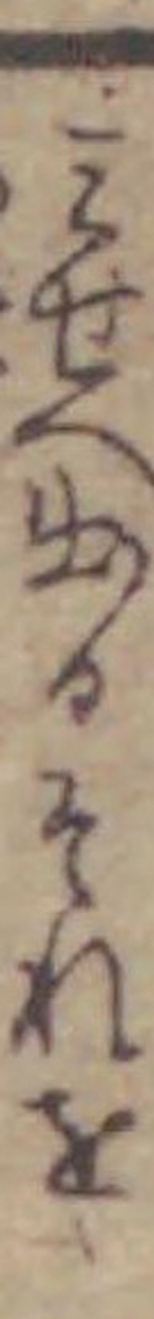みせへ出るそれを
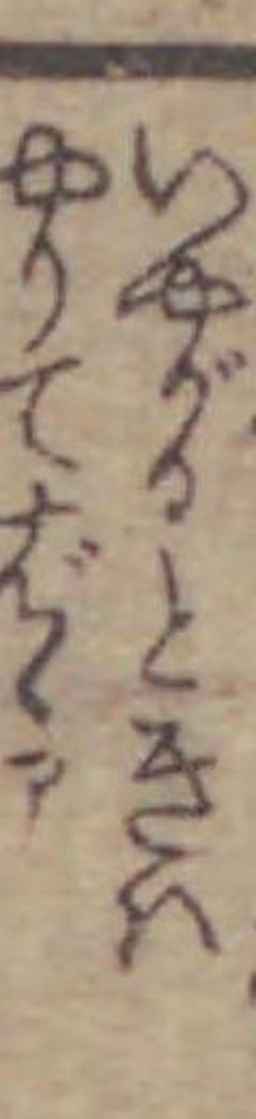やりてばゞァ
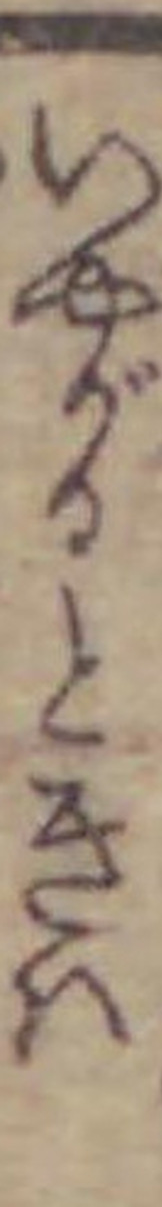いやがるときは
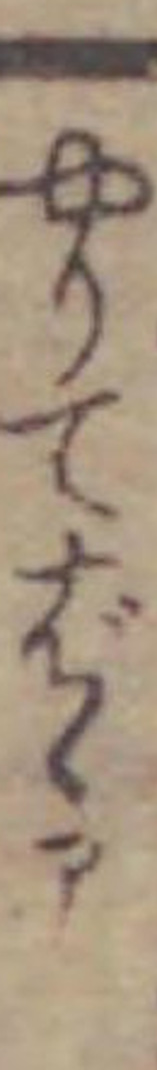やりてばゞァ
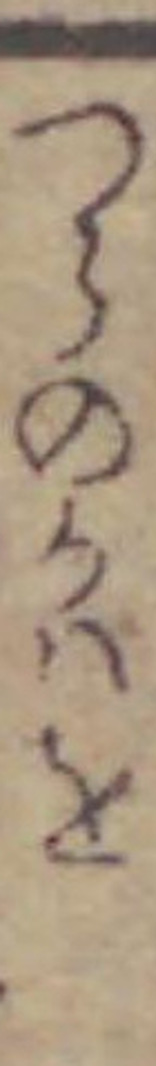つらのかはを
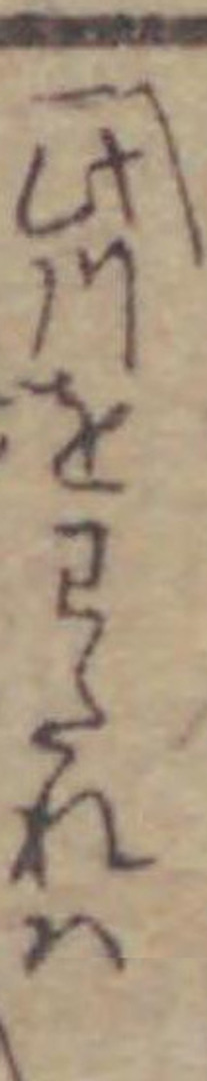「此川をわたれは
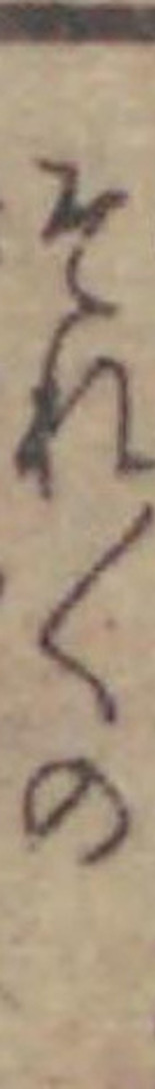それ〳〵の
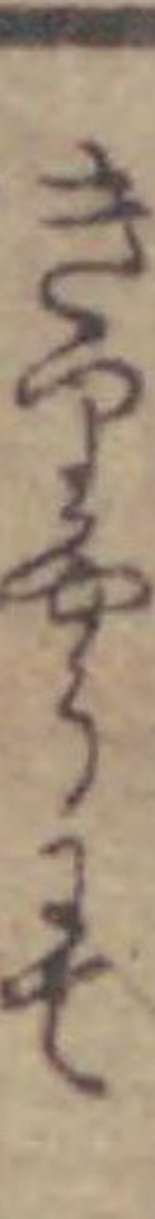きりやうにて
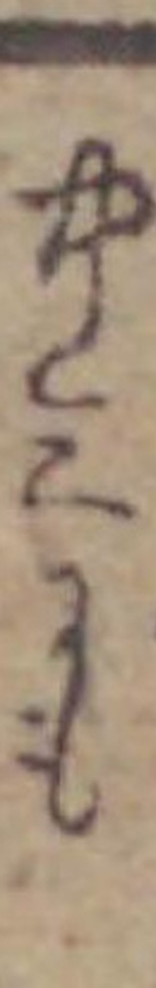中三にも
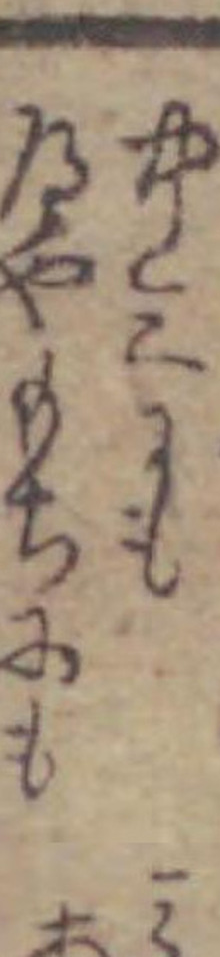へやもちにも
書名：九替十年色地獄 : 3巻
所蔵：国立国会図書館 National Diet Library, JAPAN
